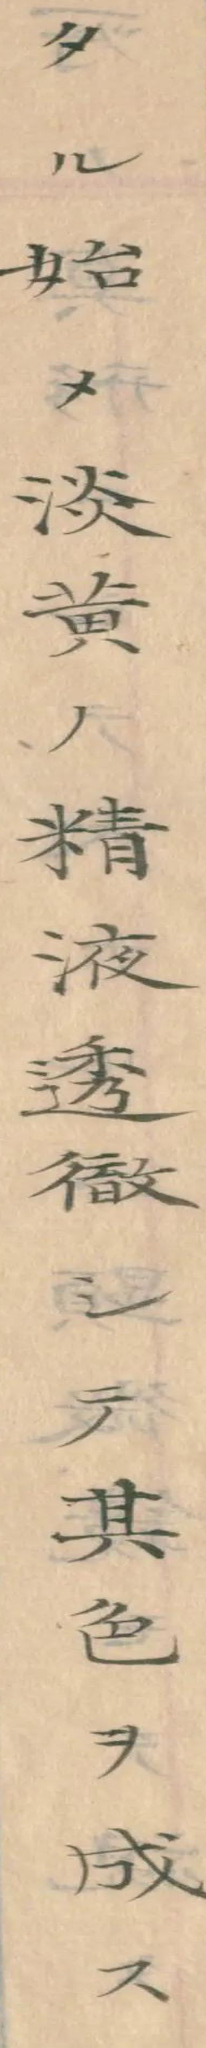タル始メ淡黄ノ精液透徹シテ其色ヲ成ス
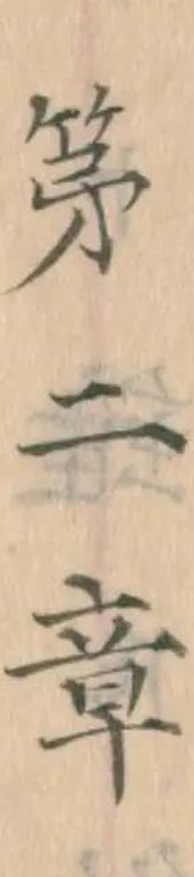第二章
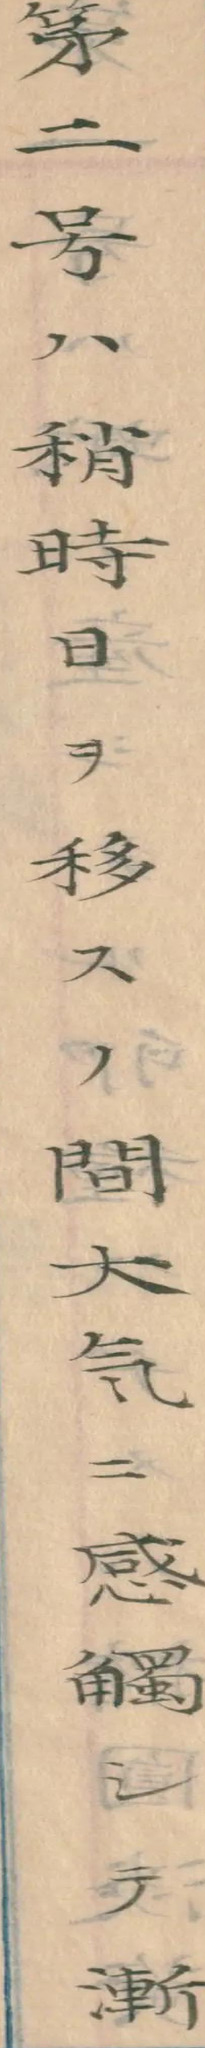第二号ハ稍時日ヲ移スノ間大気ニ感触シテ漸
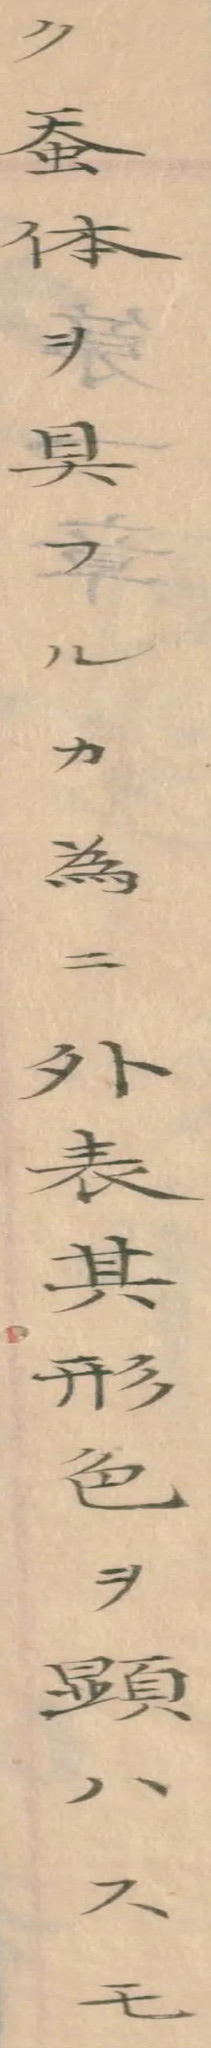ク蚕体ヲ具フルカ為ニ外表其形色ヲ顕ハスモ
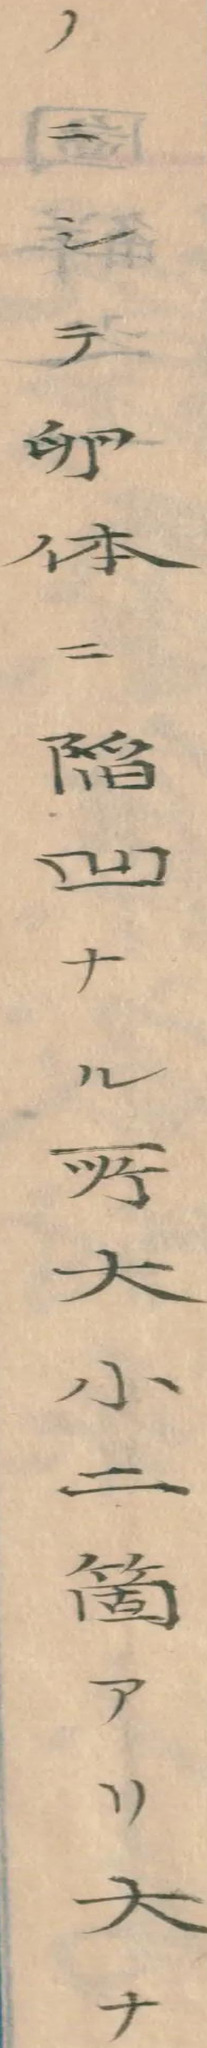ノニシテ卵体ニ陥凹ナル所大小二箇アリ大ナ
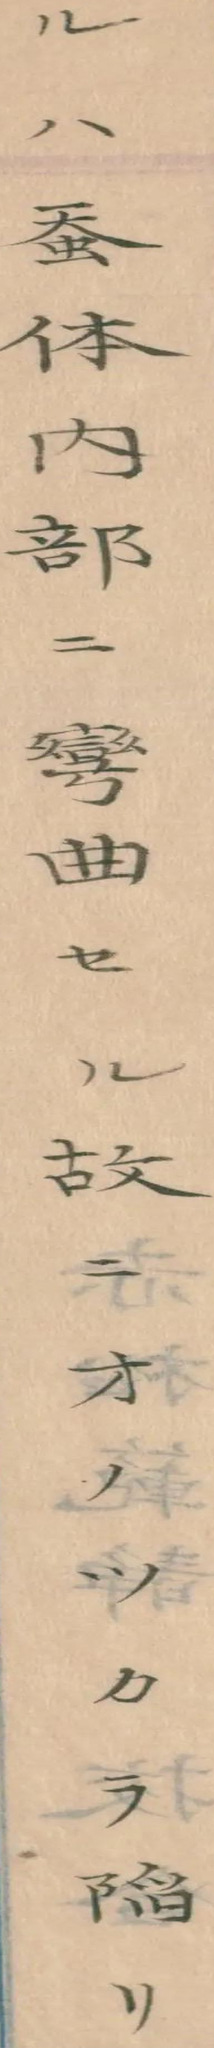ルハ蚕体内部ニ湾曲セル故ニオノツカラ陥リ
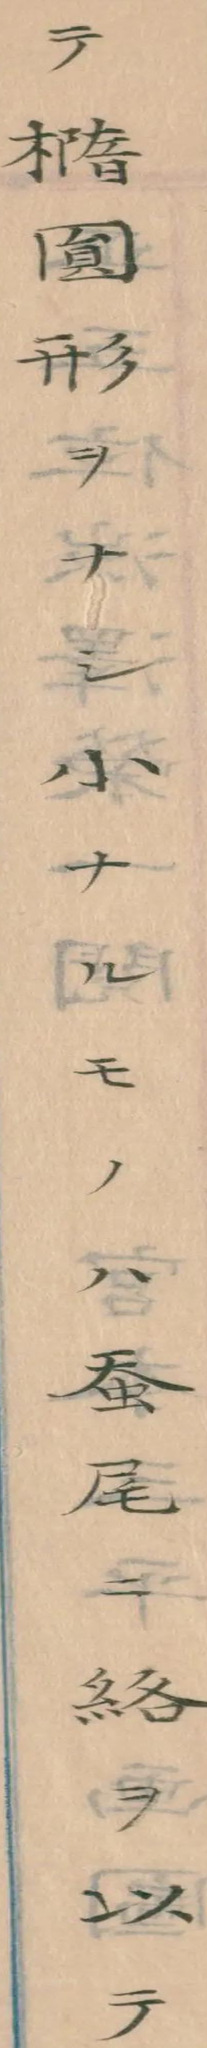テ楕円形ヲナシ小ナルモノハ蚕尾ニ絡ヲ以テ
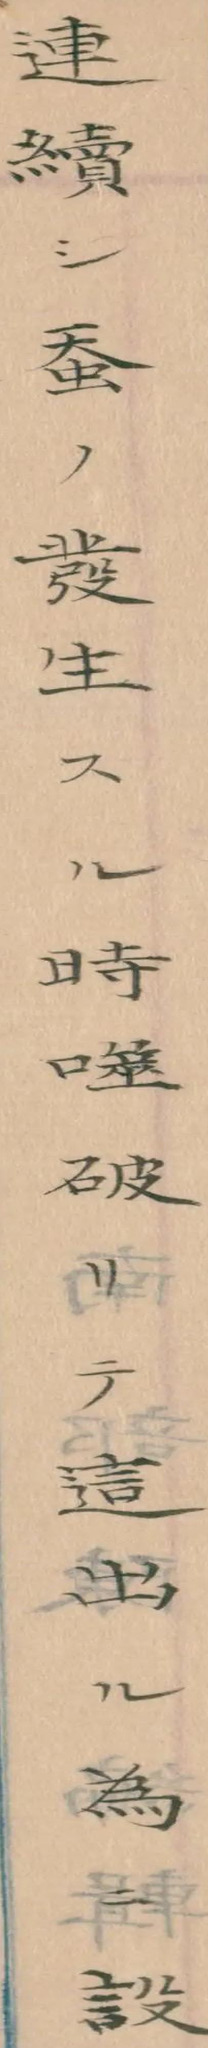連続シ蚕ノ発生スル時噬破リテ這出ル為ニ設
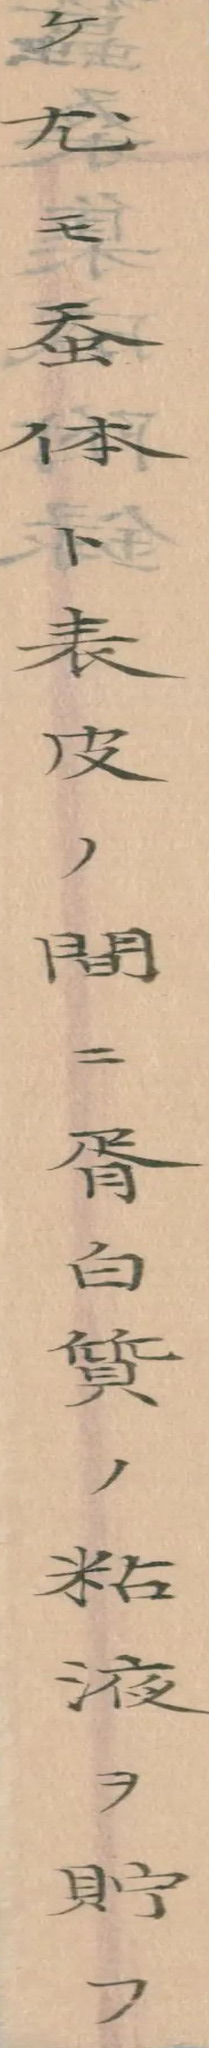ケ尤モ蚕体ト表皮ノ間ニ蛋白質ノ粘液ヲ貯フ
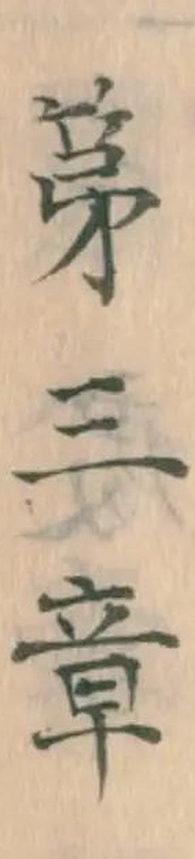第三章
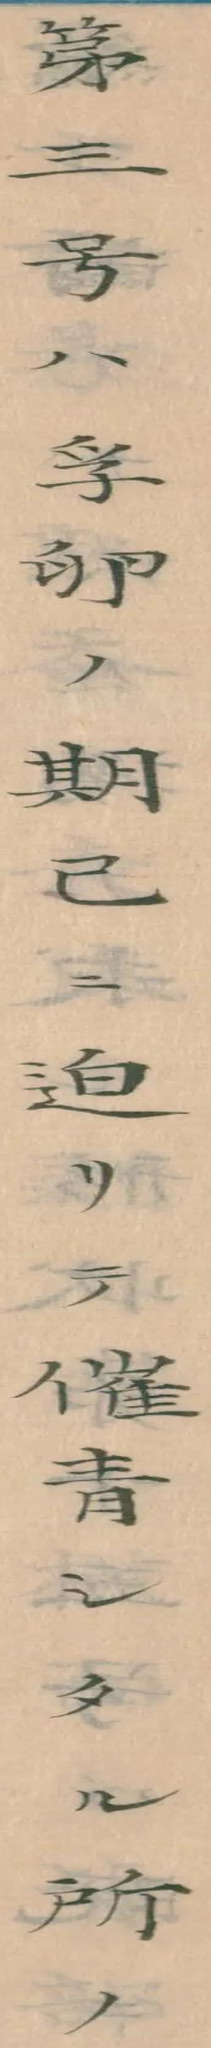第三号ハ孚卵ノ期已ニ迫リテ催青シタル所ノ
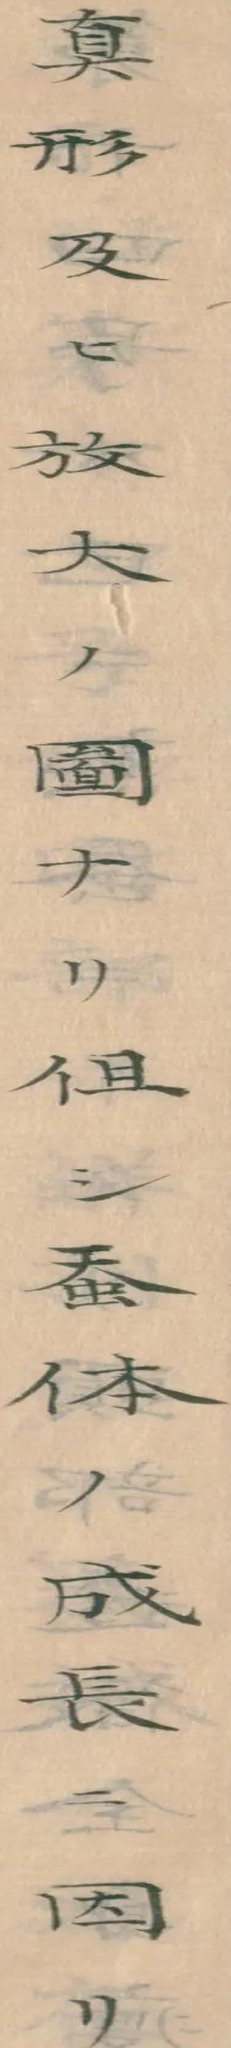真形及ヒ放大ノ図ナリ但シ蚕体ノ成長ニ因リ
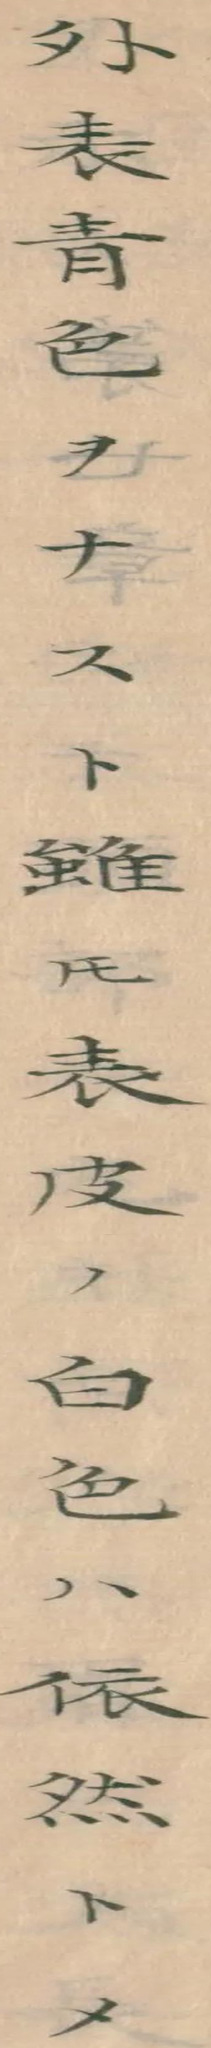外表青色ヲナスト雖トモ表皮ノ白色ハ依然トシテ
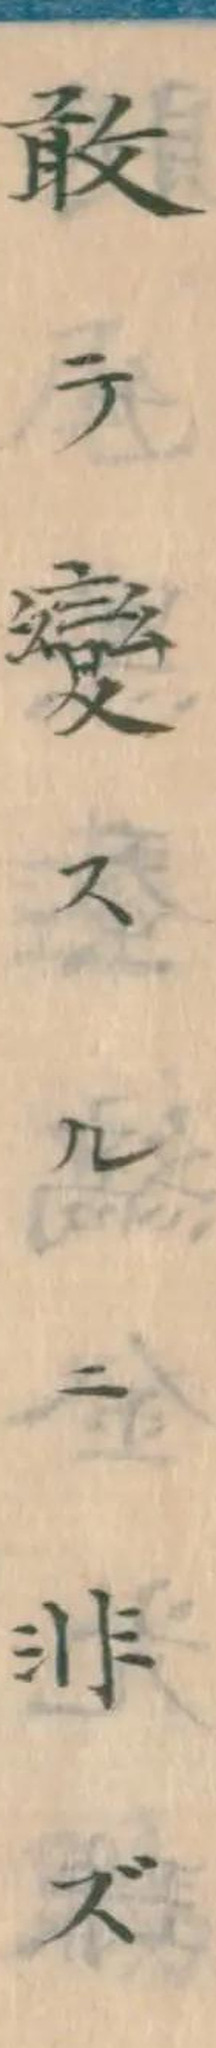敢テ変スルニ非ズ
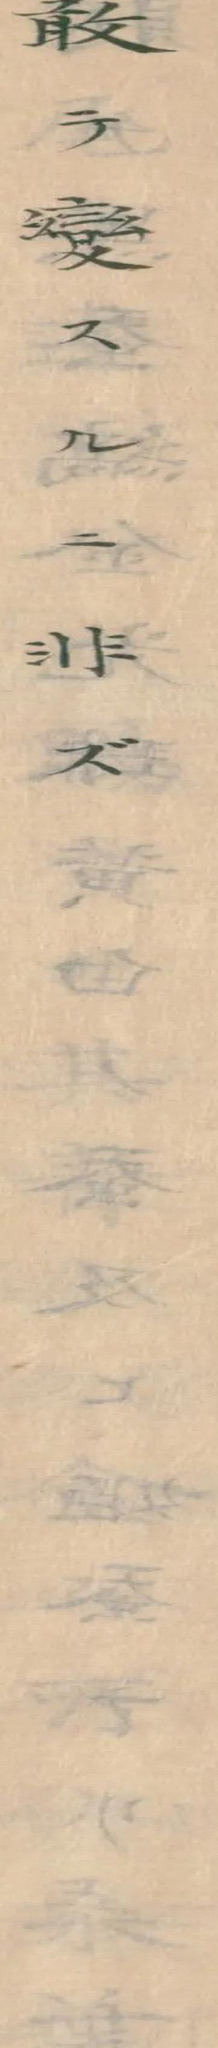敢テ変スルニ非ズ
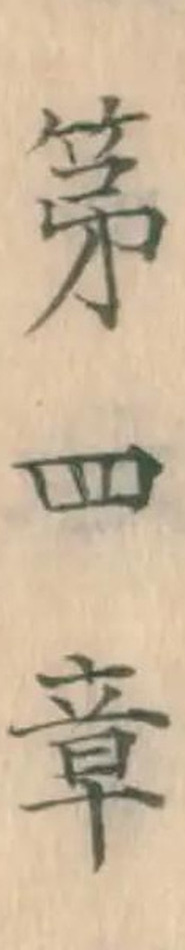第四章
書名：蚕桑集成
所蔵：国立国会図書館 National Diet Library, JAPAN
